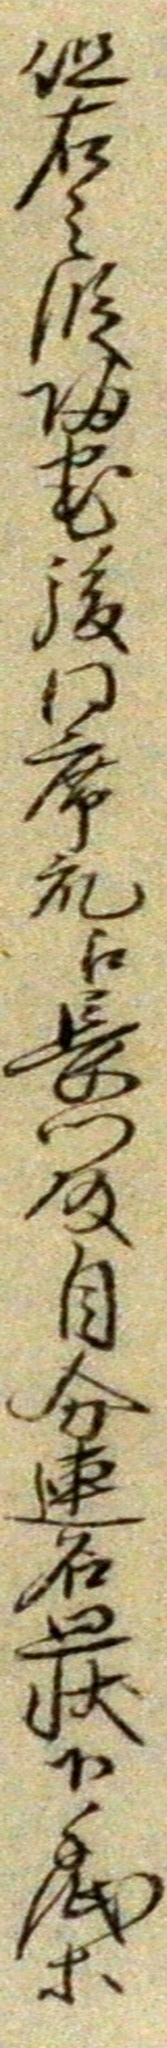但右之段帰宅後同席衆え長門殿自分連名廻状下手紙等
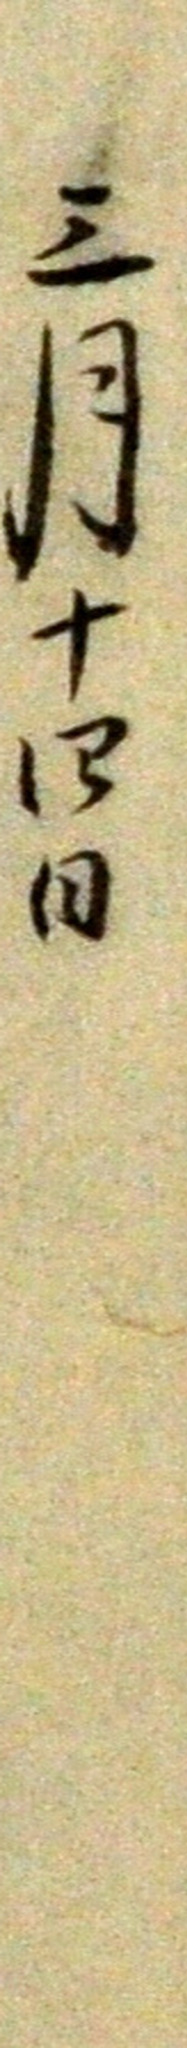三月十四日
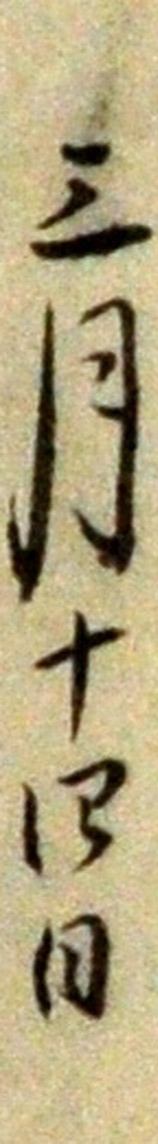三月十四日
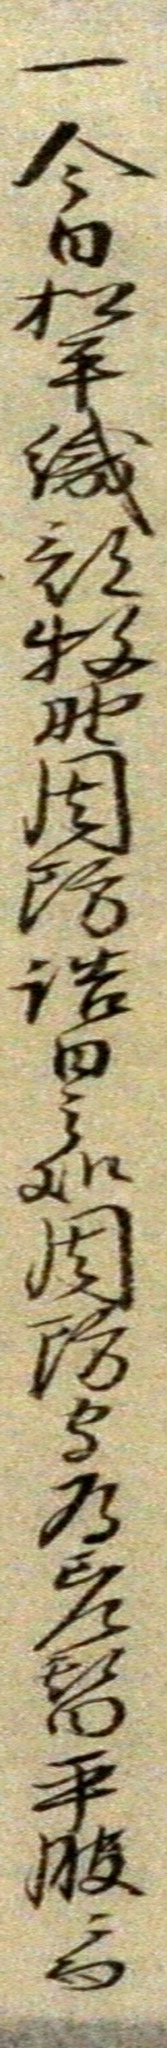一今日松平織部牧野周防詰日之処周防守為差替平服ニ而
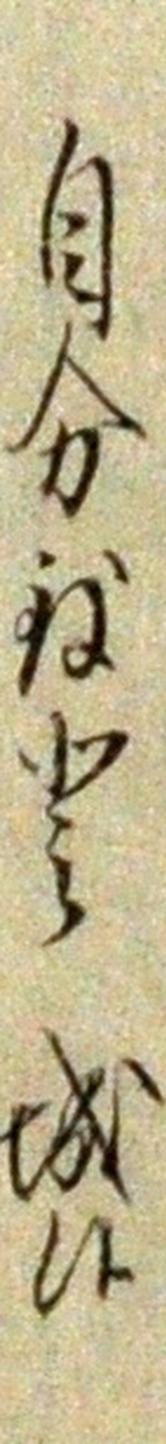自分致登城候
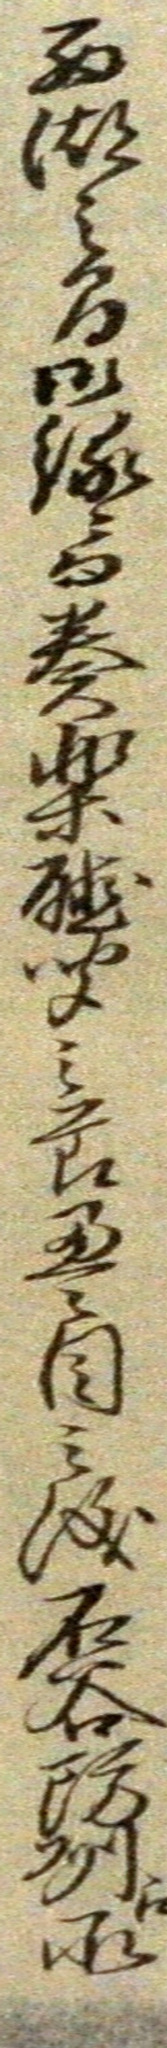一西湖之間御縁ニ而奏楽聴聞之節畳目之儀石谷防州え承
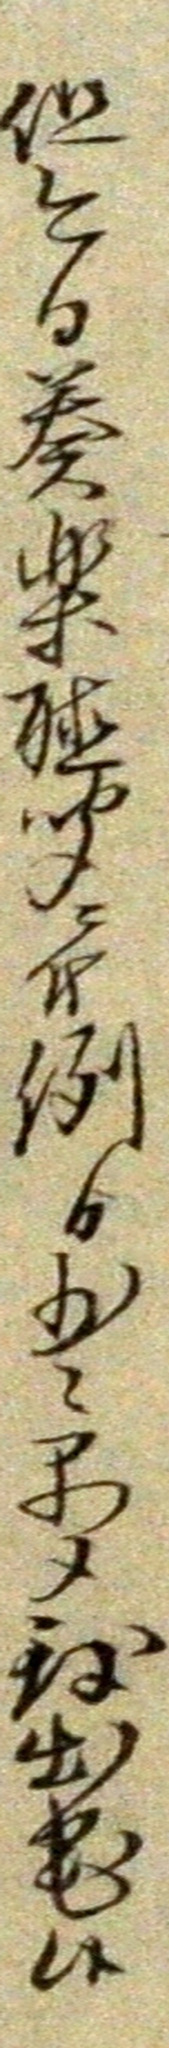但今日奏楽聴聞ニ付例ゟ少々早メ致出宅候
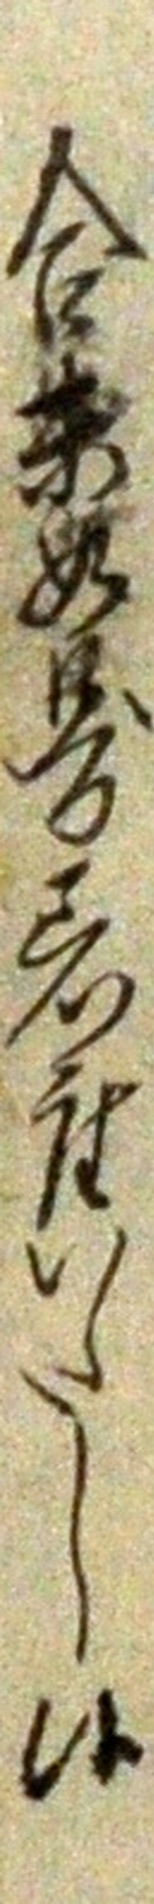合末如図着座いたし候
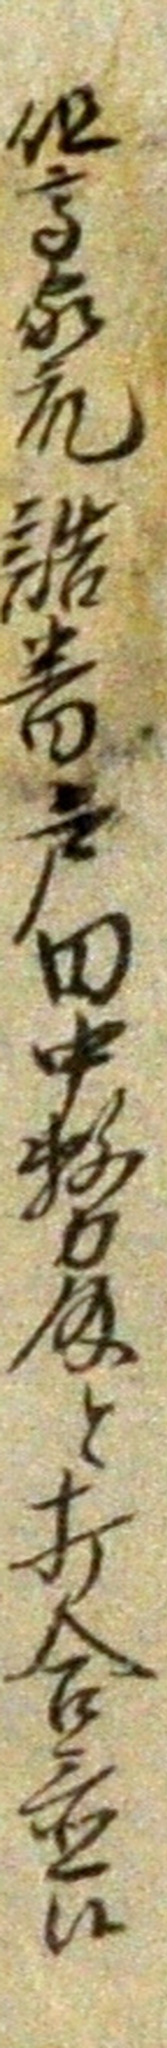但高家衆詰番戸田中務殿と打合置候
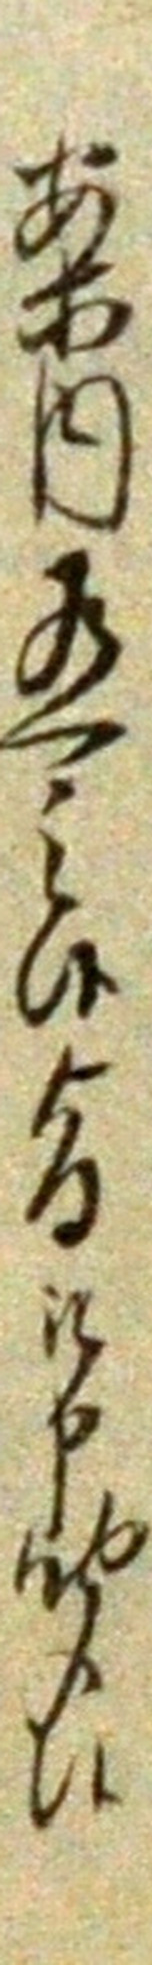案内有之候旨被申聞候
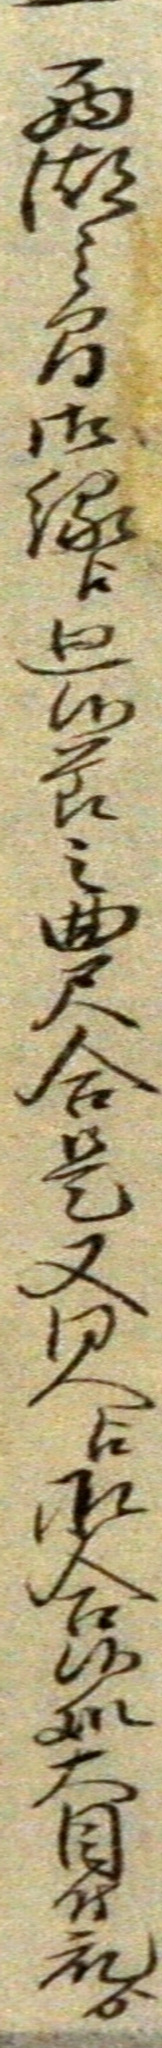一西湖之間御縁え廻候節之曲尺合是又同人え承合候処大目付衆ゟ

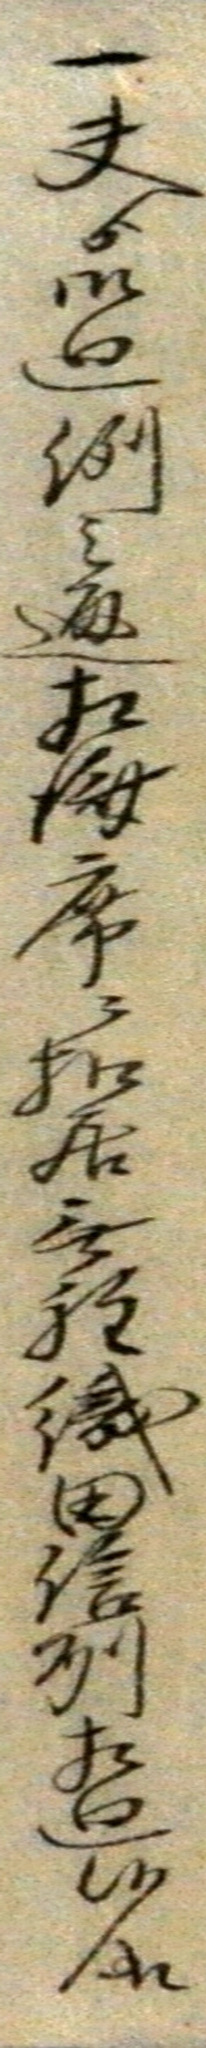一夫ゟ御廻例之通相済席ニ扣居無程織田信州相廻候様
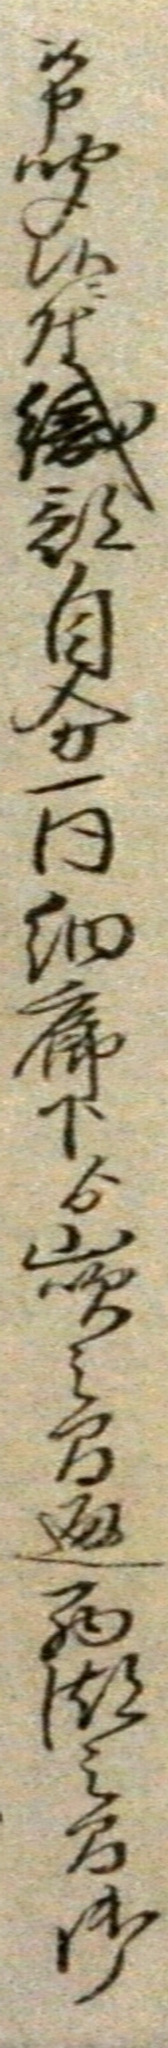被申聞候ニ付織部自分一同細廊下ゟ山吹之間通西湖之間御
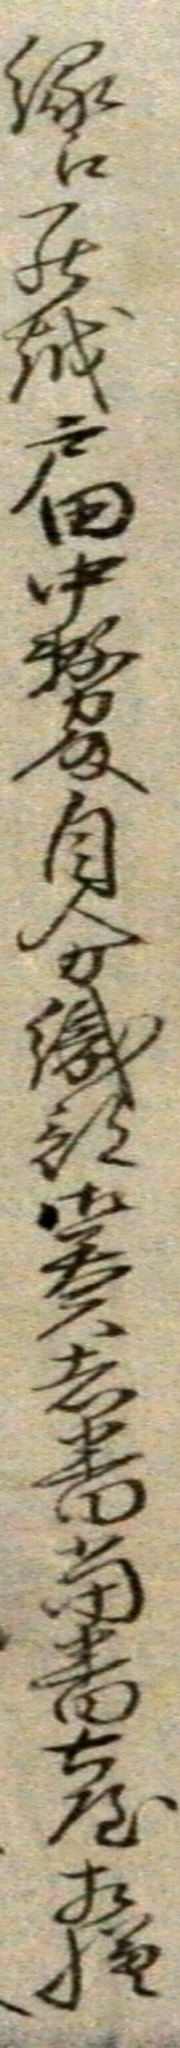縁え罷越戸田中務殿自分織部御奏者番当番土屋相模
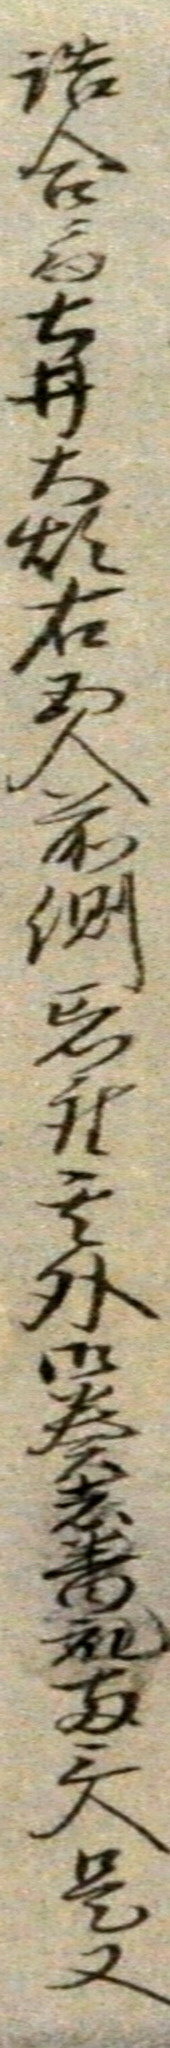詰合ニ而土井大炊右五人前側着座其外御奏者番衆両三人是又
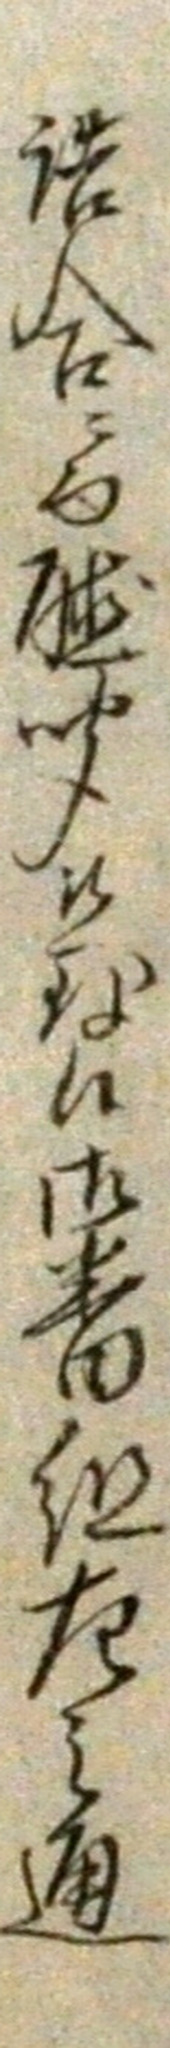詰合ニ而聴聞被致候御番組左之通
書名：奏楽聴聞致シ候節ノ留
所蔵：伊那市立高遠町図書館・合同会社AMANE
